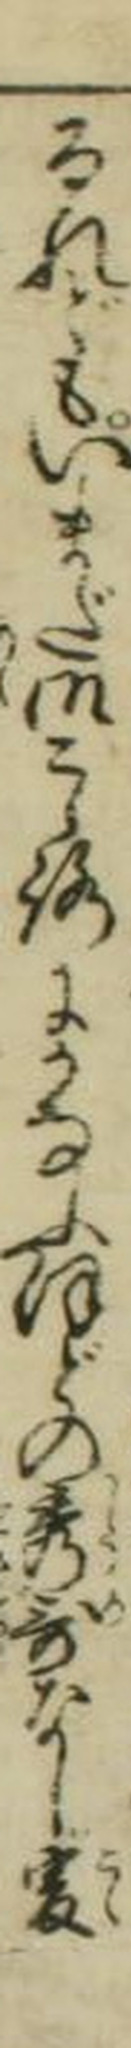るれども。いまだ御こゝろにかなふほどの秀哥なし爰
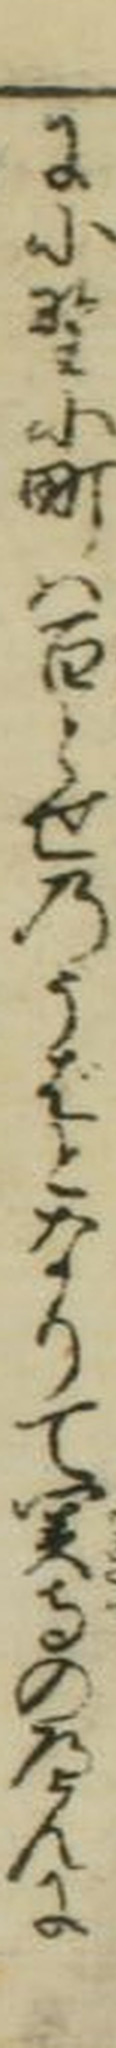に小野小町は百とせのうばとなりて関寺のへんに
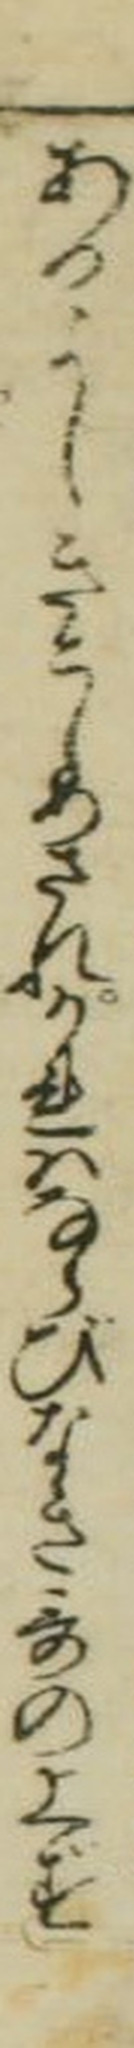あるよしきこしめされ。かれはならびなき哥の上ず
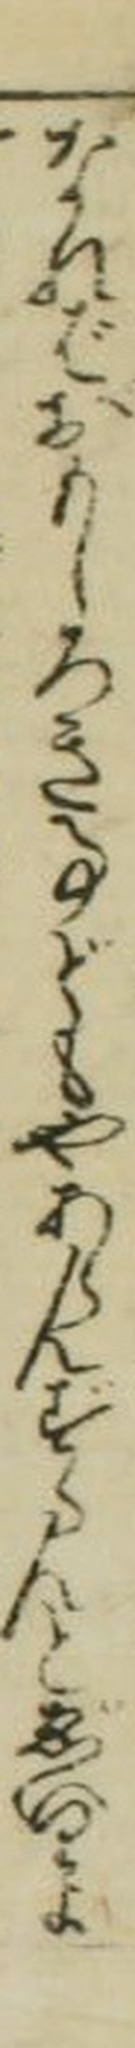なれば。おもしろき事どもやあらんずらんと。ゑいりよ
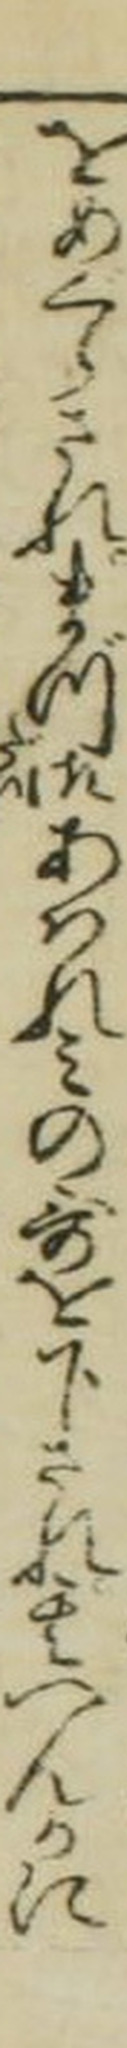をめぐらされ。まづ御あはれみの哥を下され。其へんかに
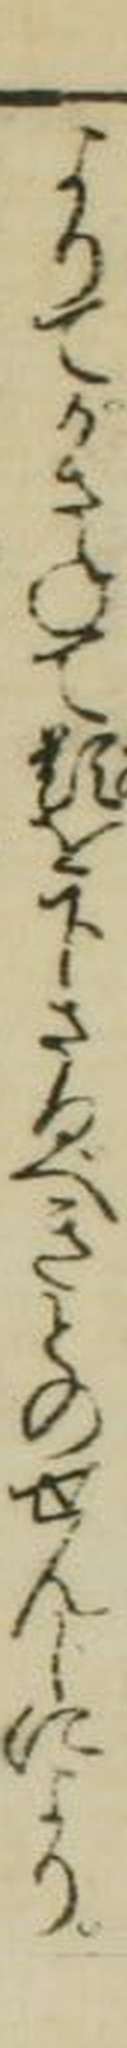よりて。かさねて題を下さるべきとのせんしにより。
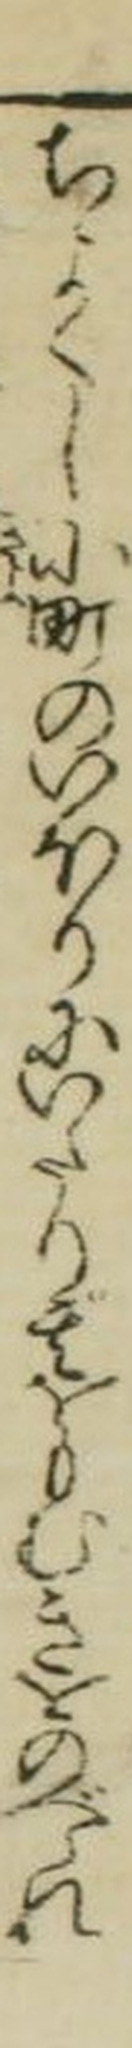ちよくし小町のいほりにいたり。其をもむきをのべられ
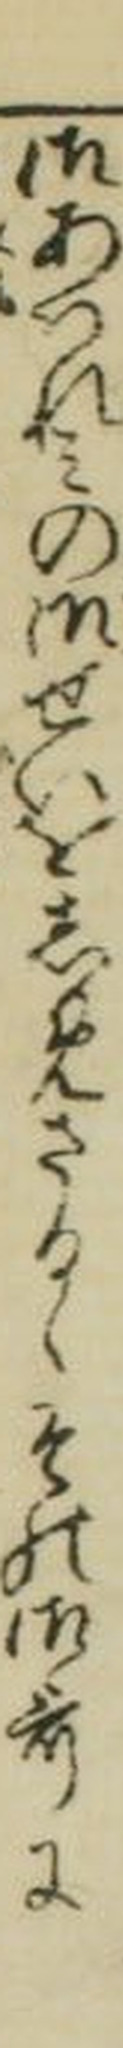御あはれみの御せいをしめさるゝその御哥に
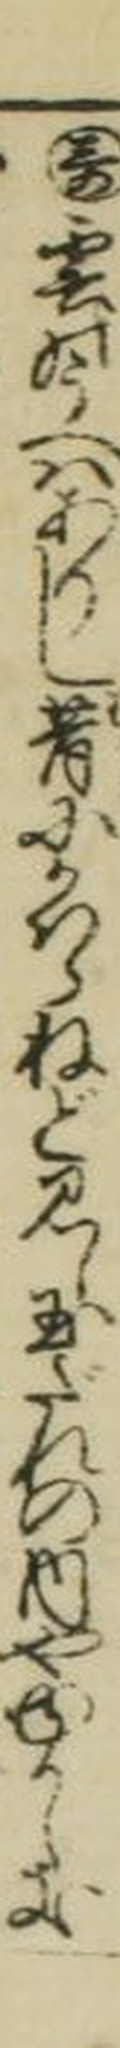哥雲のうへはありし昔にかはらねど見し玉だれの内やゆかしき
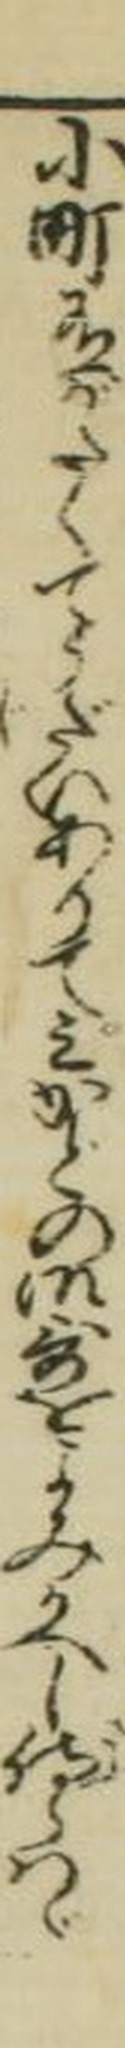小町有がたくてうだいありてみかどの御哥をよみかへし侍らはゞ
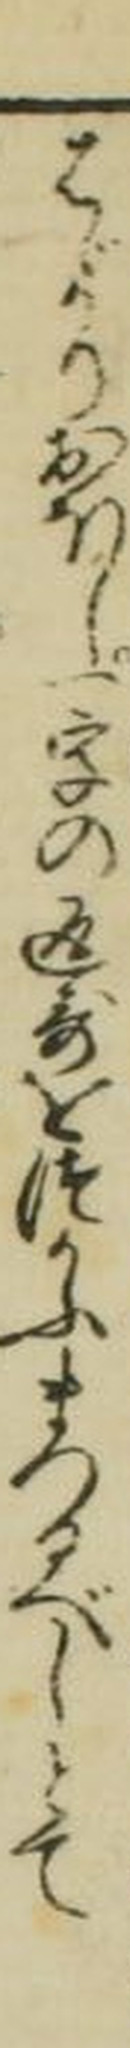はゞかりおほし。一字の返哥をつかふまつるべしとて
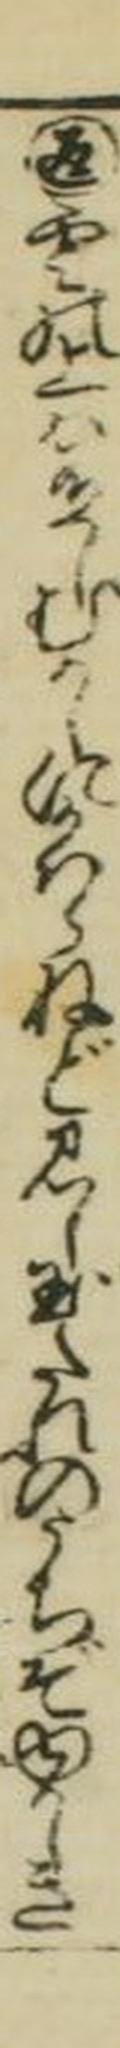返雲の上は有しむかしにかはらねど見し玉たれのうちぞゆかしき
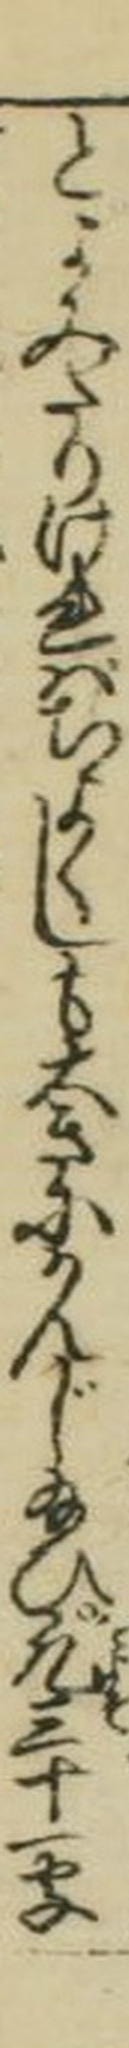とよみたりければちよくしも大きにかんじ給ひ。凡三十一字見える
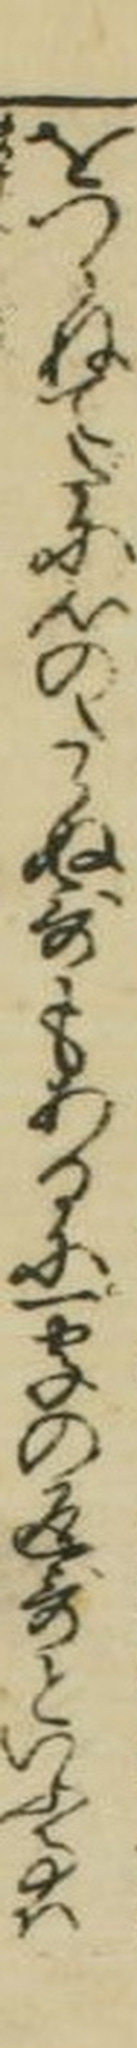をつらねてだに心のたらぬ哥もあるに一字の返哥といふ事は
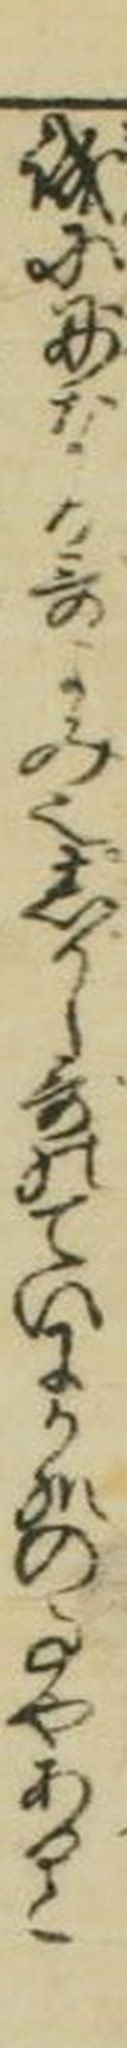誠に妙なる哥よみ也。しかし哥のていにか様の事やあると
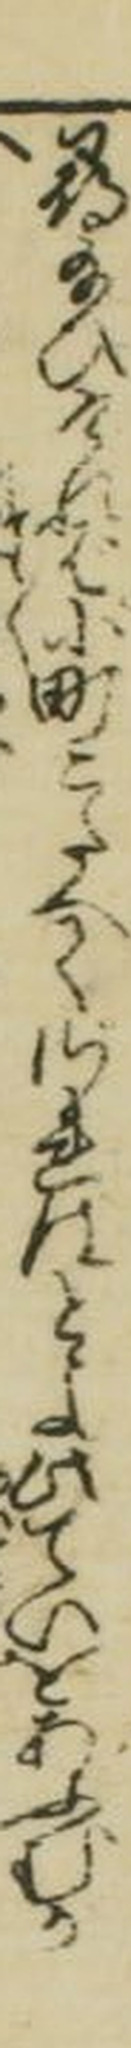尋給ひければ。小町こたへて。されはとよ此ていをあふむか
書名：女源氏教訓鑑
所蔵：東京学芸大学附属図書館
